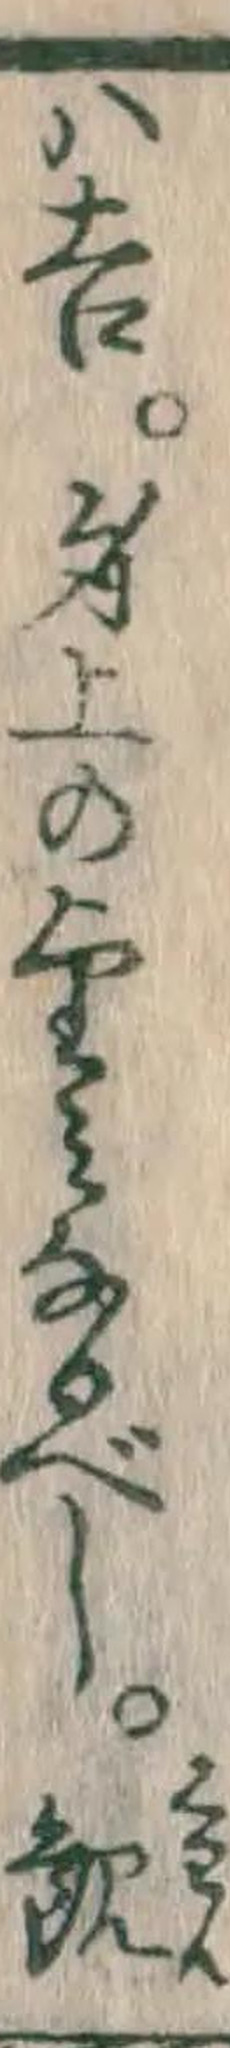は吉。身上の望みなるべし。観
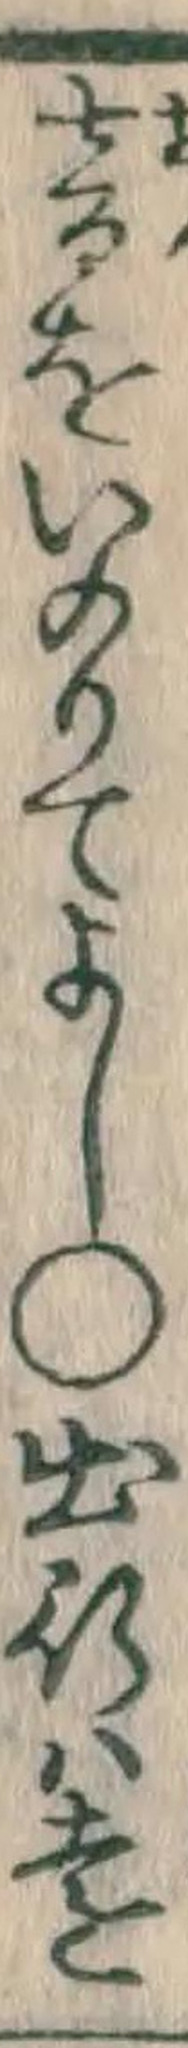音をいのりてよし○出行は遠
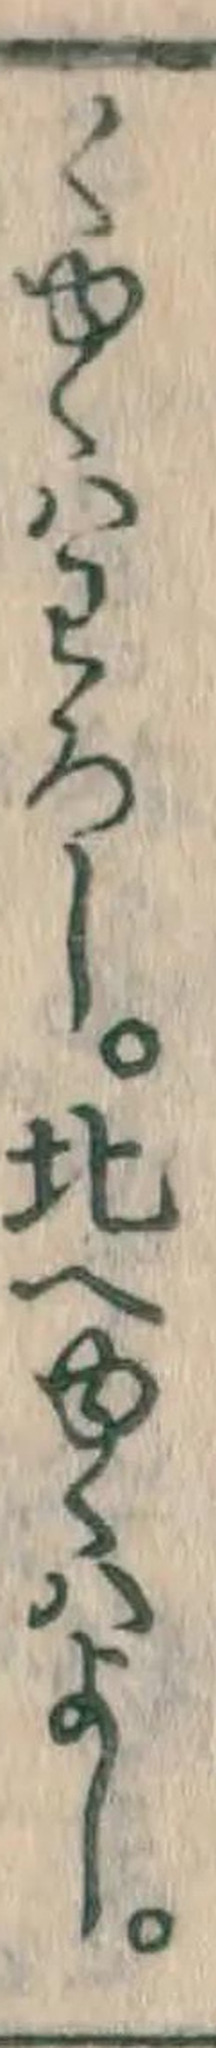くゆくはわろし。北へゆくはよし。
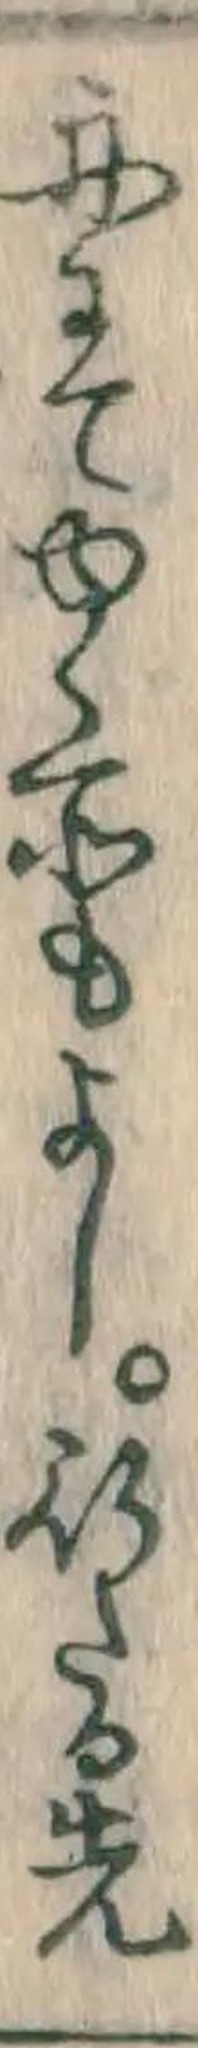舟にてゆく所もよし。行たる先
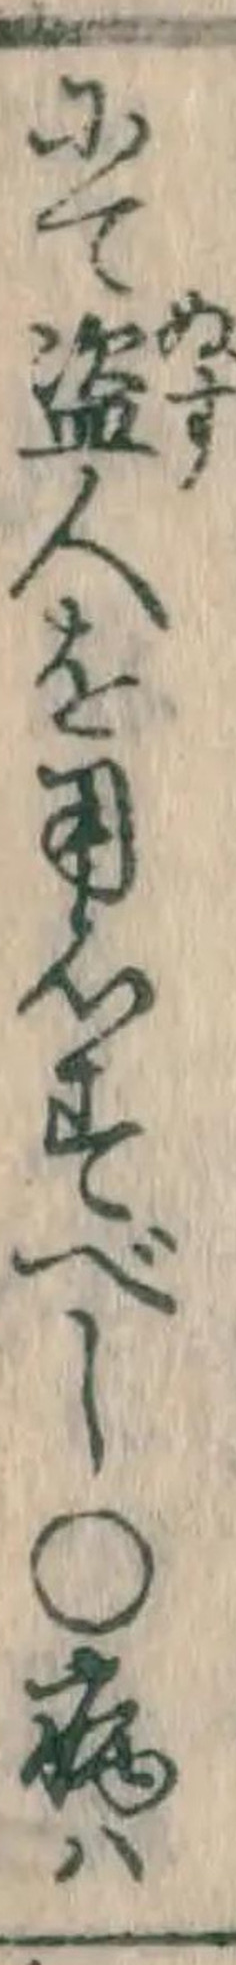にて盗人を用心すべし○病は

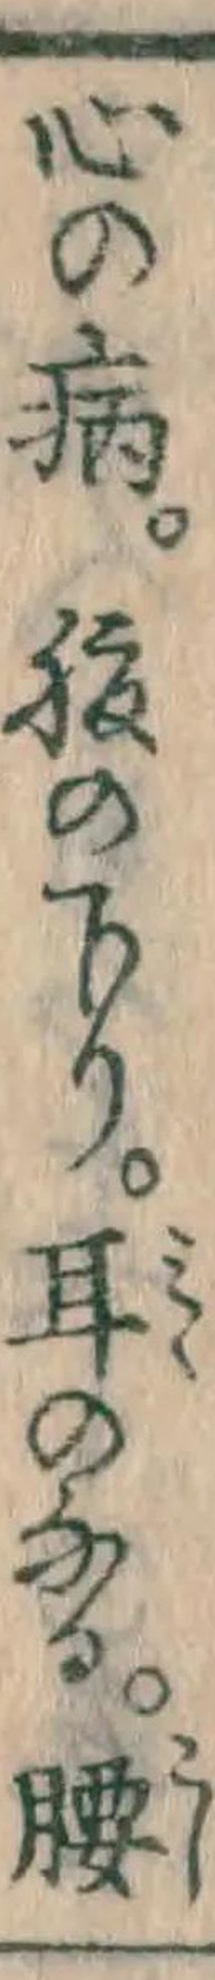心の病。腹の下り。耳のなる。腰
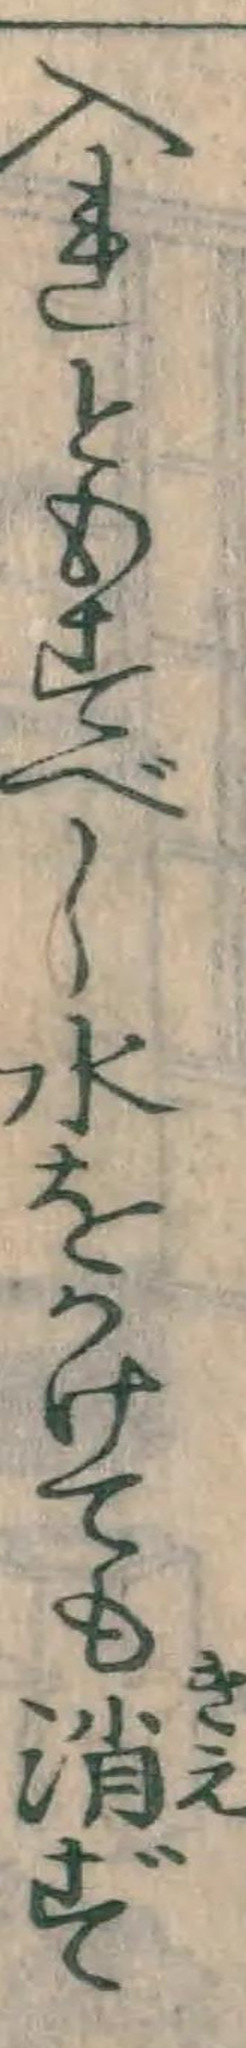入れともすべし水をかけても消ず
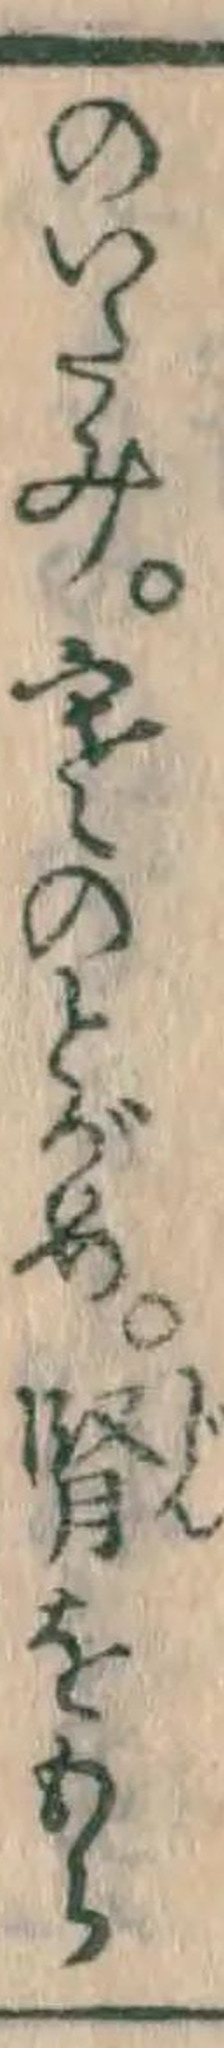のいたみ。寒のとがめ。腎をもら
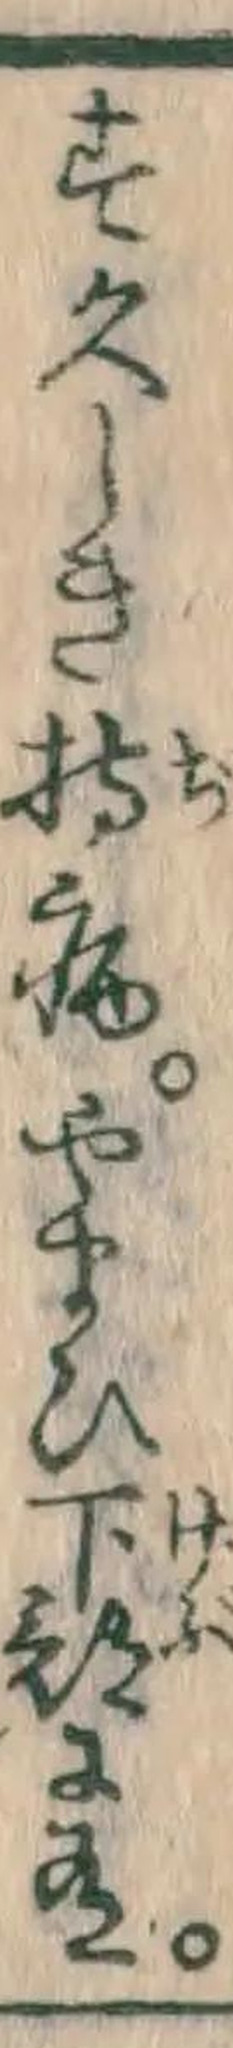す久しき持病。やまひ下部に有。
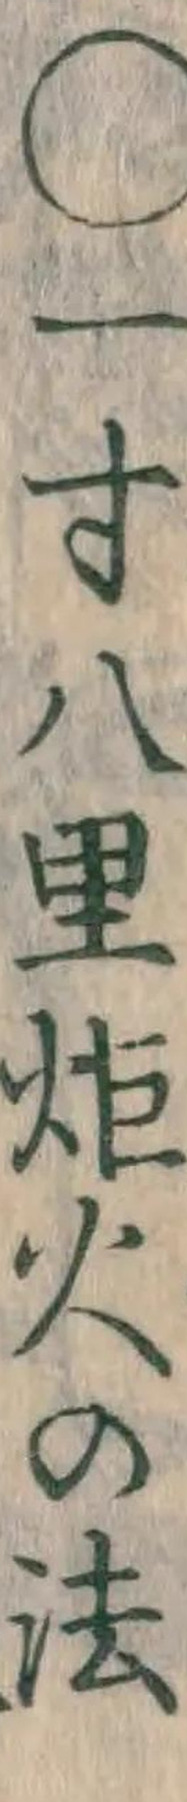○一寸八里炬火の法
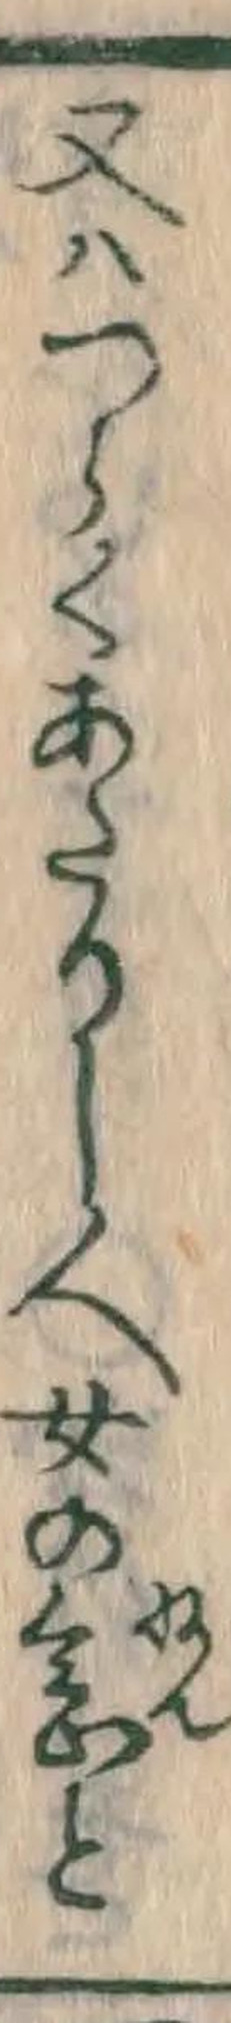又はつらくあたりし人女の念と
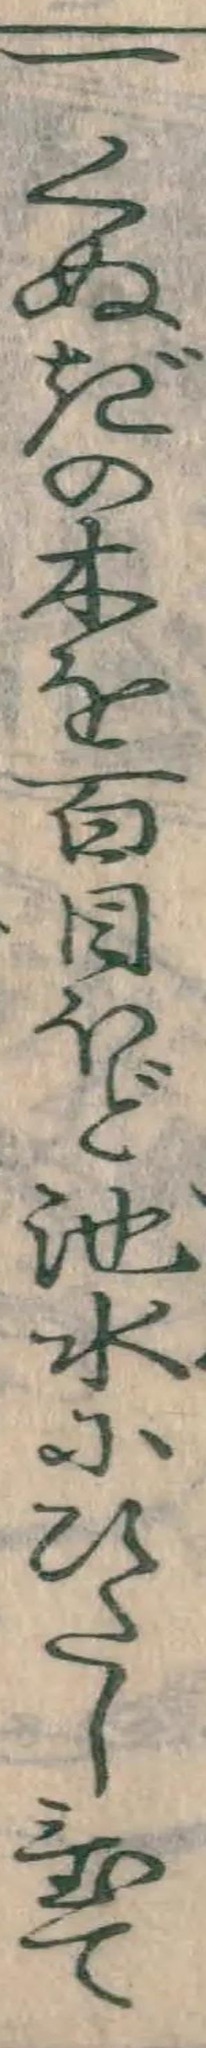一くぬぎの木を百目ほど池水にひたし置て
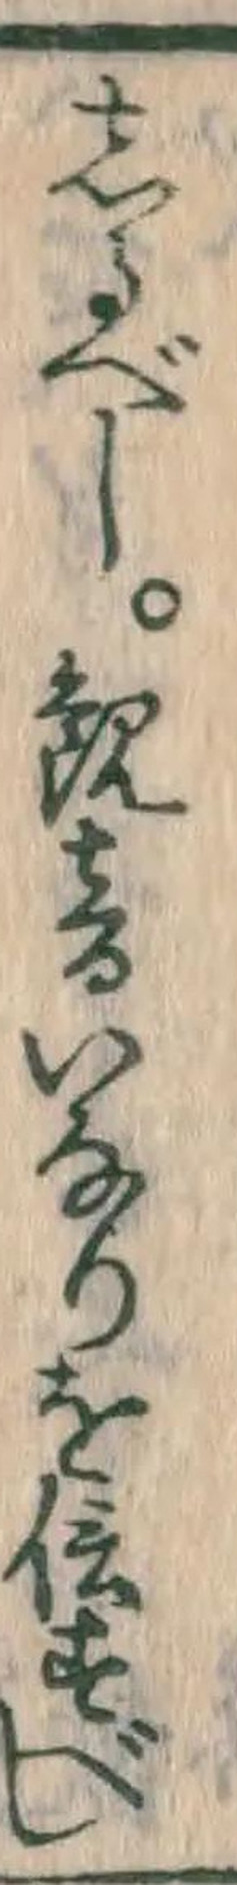しるべし。観音いなりを信すべし
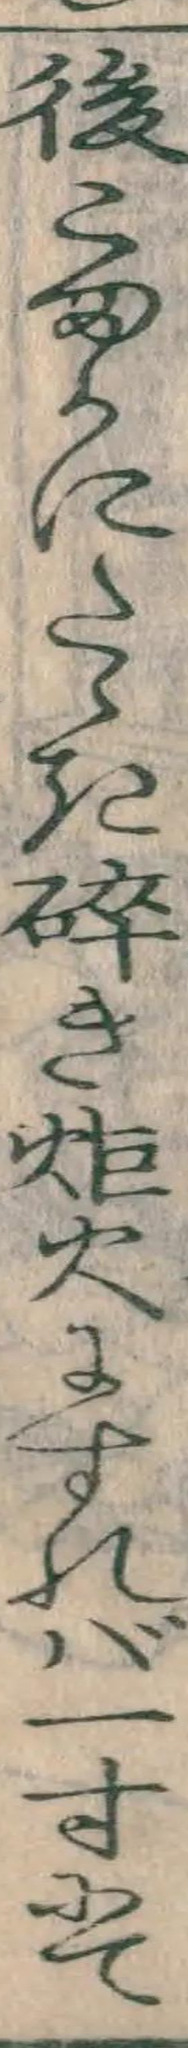後こまかにたゝき砕き炬火にすれば一寸にて
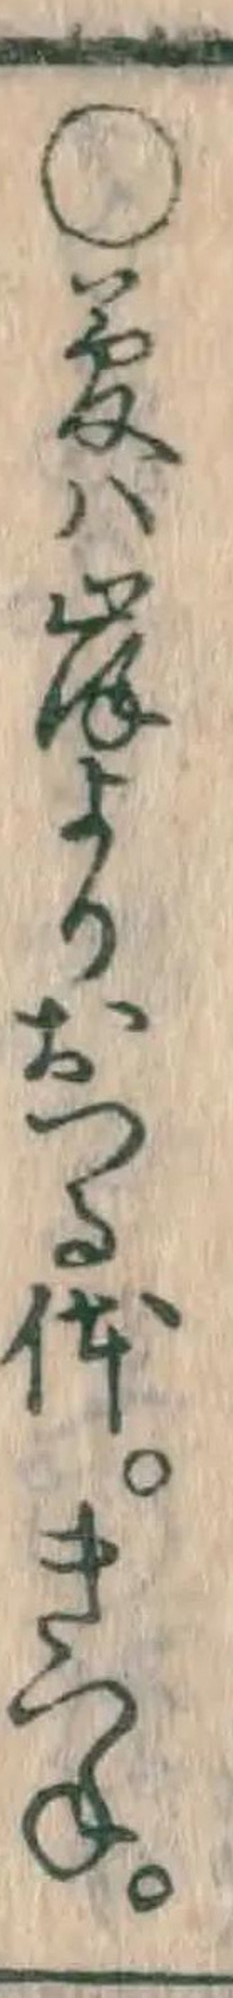○夢は岸よりおつる体。きつね。
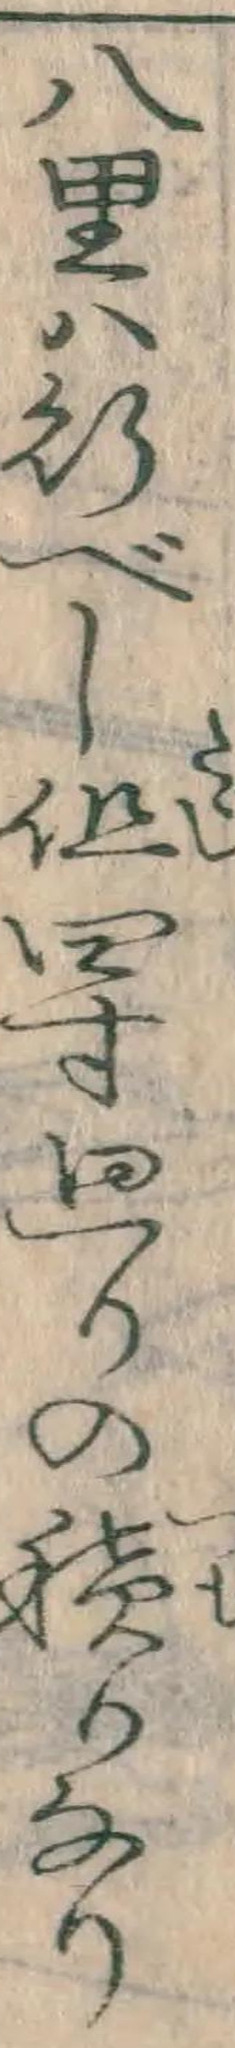八里は行べし但四寸廻りの積りなり
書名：広益秘事大全 3巻. [1]
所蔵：国立国会図書館 National Diet Library, JAPAN
